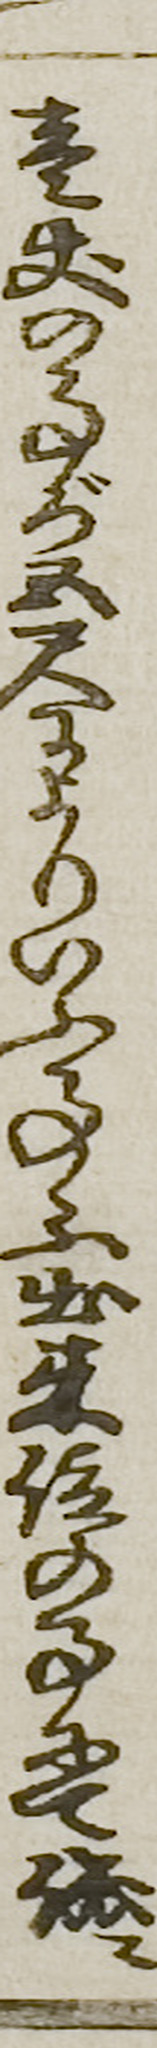壱丈の事が五尺によりいふ事不出来位の事にて誠に
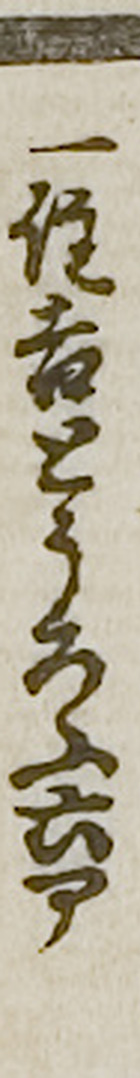一住吉とうろふ六部
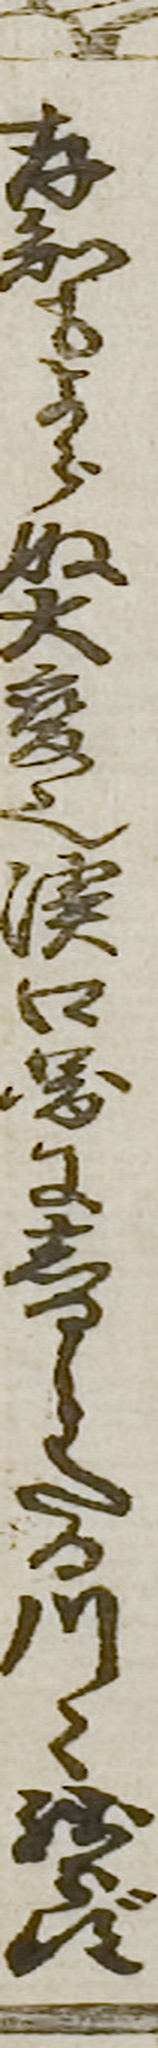存知もよらぬ大変也浜口図にしるしたる川々残らず
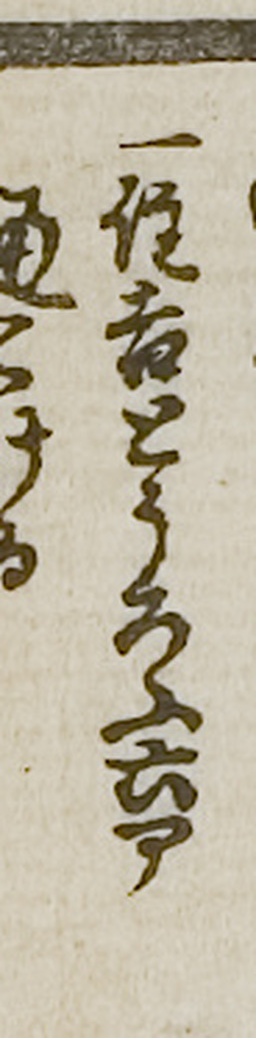通こける
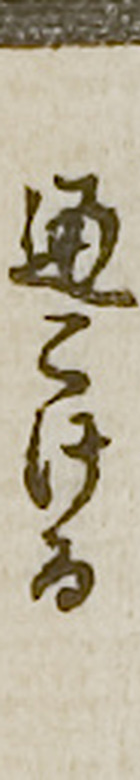通こける
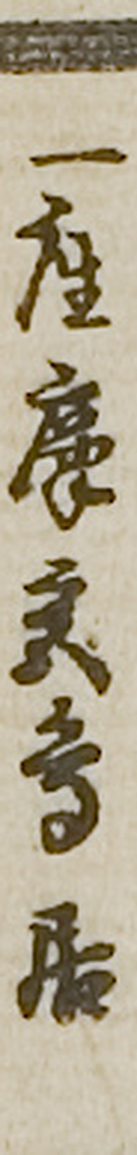一座摩宮鳥居
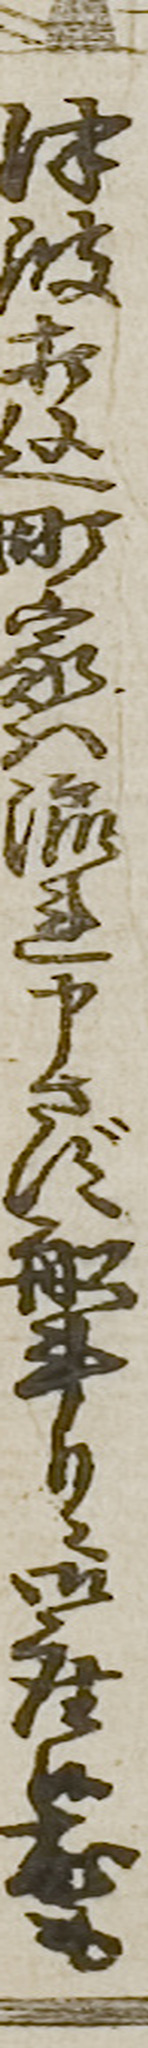津波打込町家は流れ申さず船斗りに御座候尤も
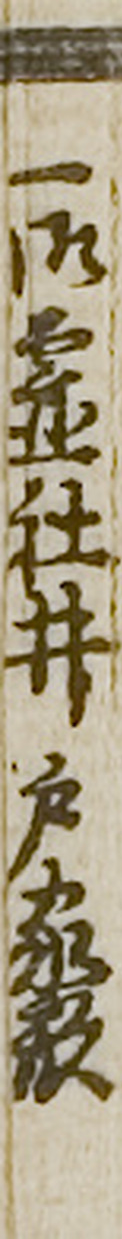一御霊社井戸家形
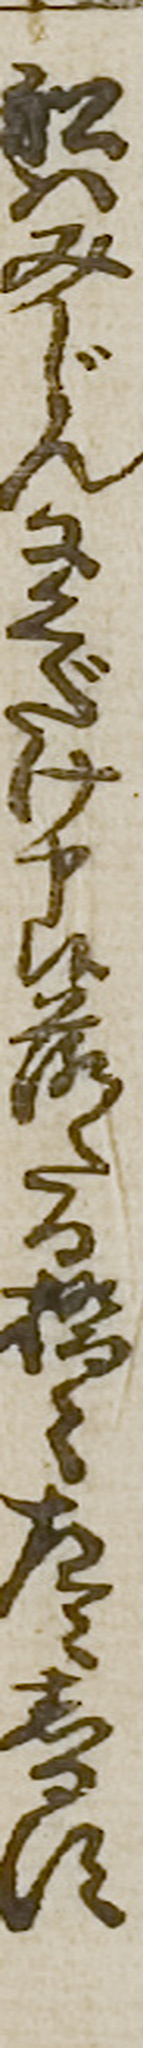船はみじんにくだけ申候落たる橋々左にしるす
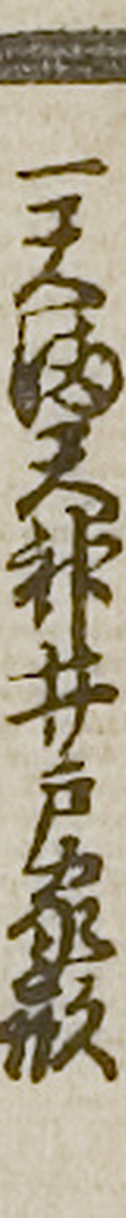一天満天神井戸家形
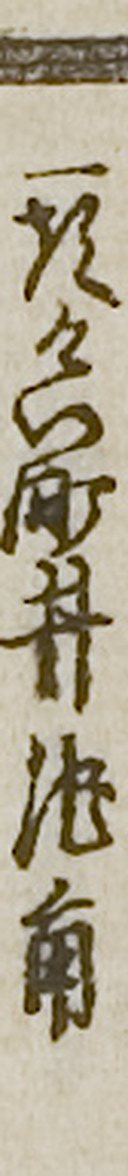一坂けい町丼池南
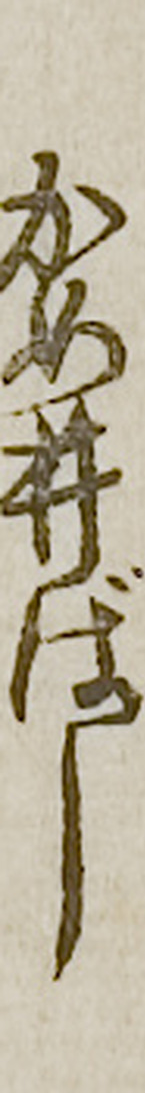かなやばし
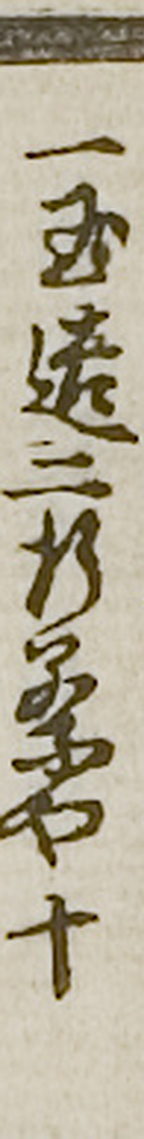一玉造二軒茶や十
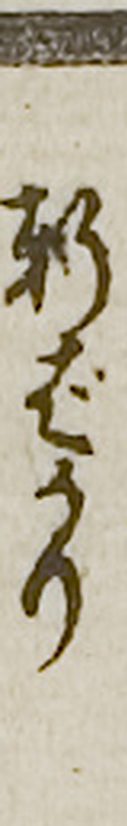軒ばかり
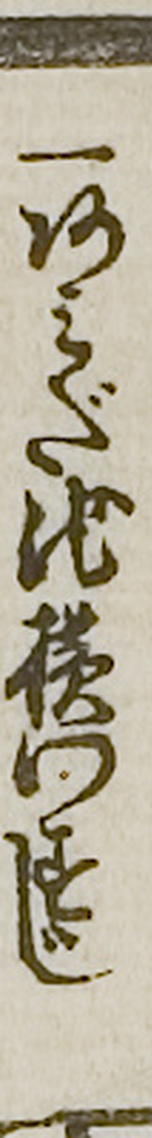一あみだ池横門すじ
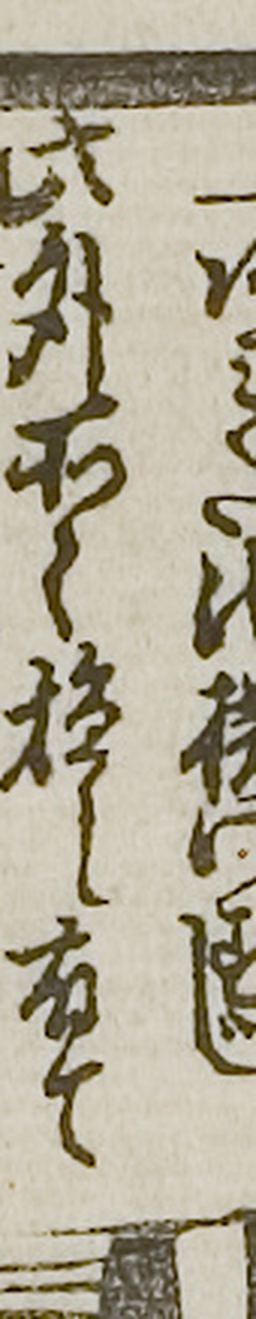此外所々損じ有て
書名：大坂辺東海道本しらべ大地震津波図
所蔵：東京大学総合図書館 General Library in the University of Tokyo, JAPAN
